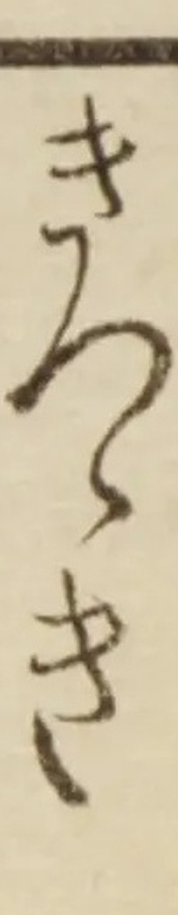きつゝき
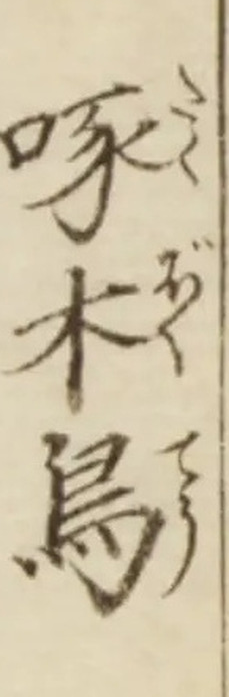啄木鳥
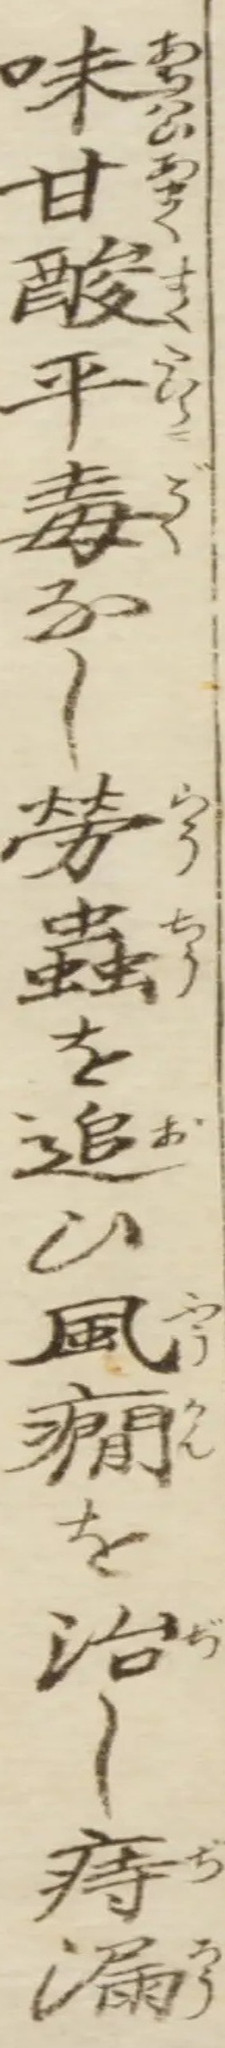味甘酸平毒なし労虫を追ひ風癇を治し痔漏
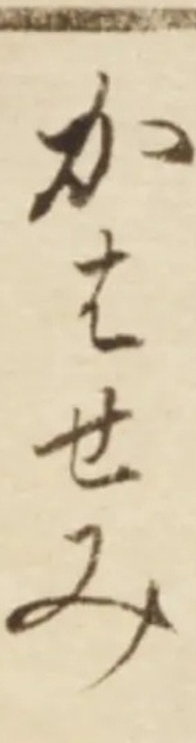かはせみ

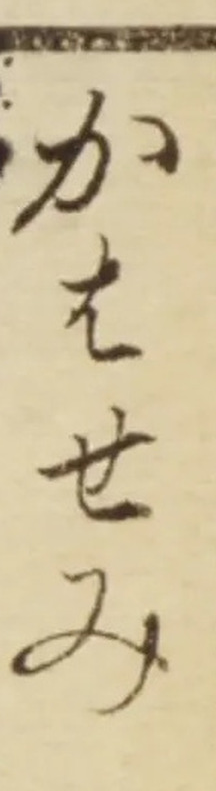かはせみ
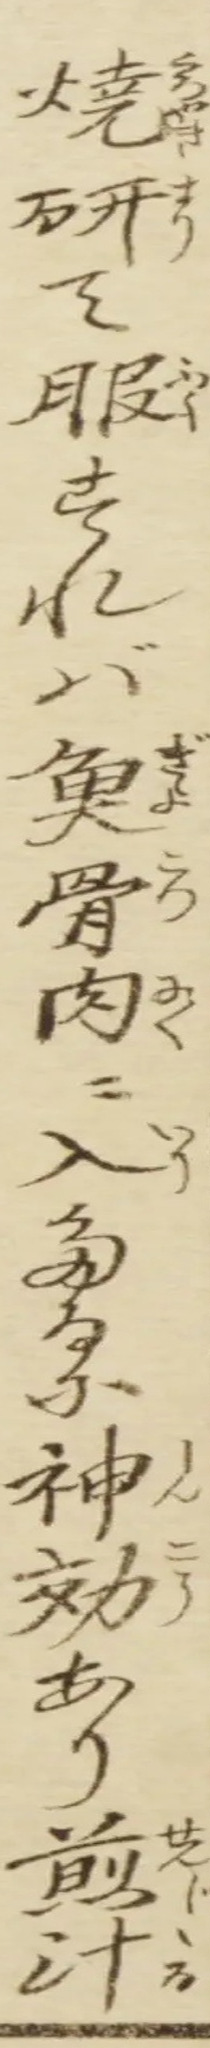焼研て服すれば魚骨肉に入たるに神効あり煎汁
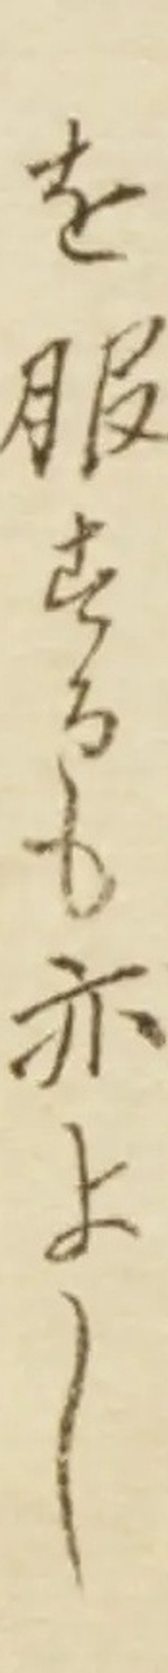を服するも亦よし
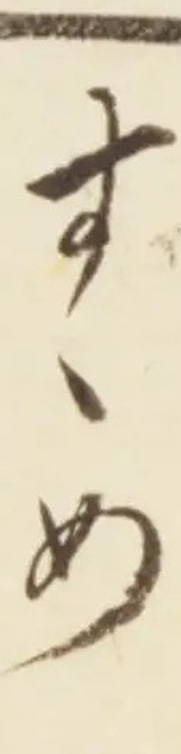すゝめ

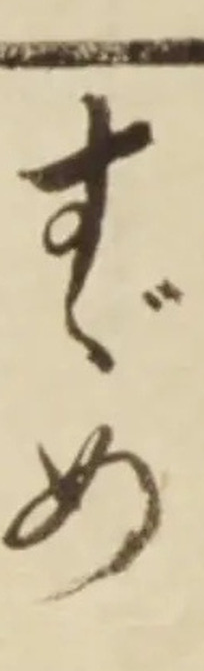すゞめ
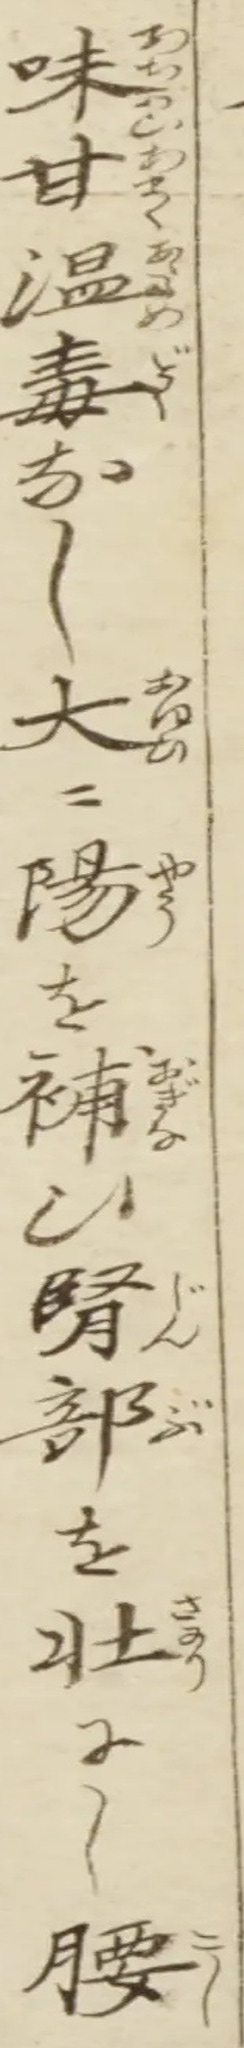味甘温毒なし大に陽を補ひ腎部を壮にし腰
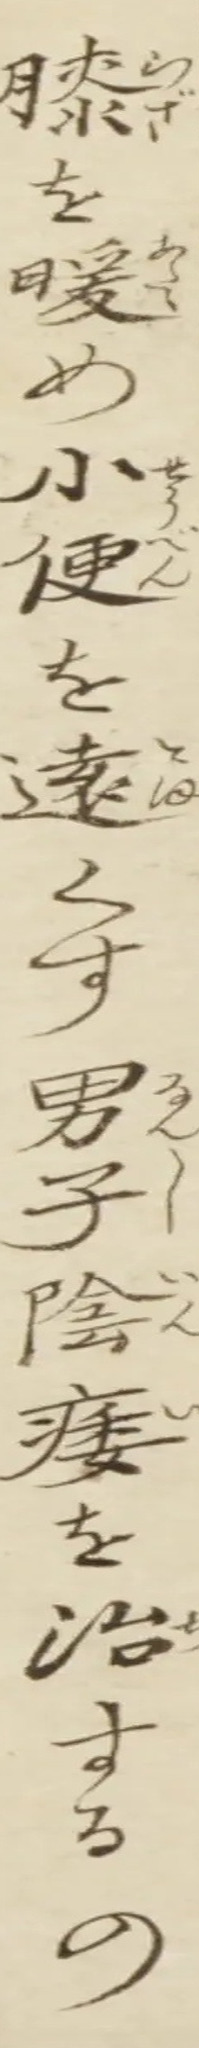膝を暖め小便を遠くす男子陰痿を治するの
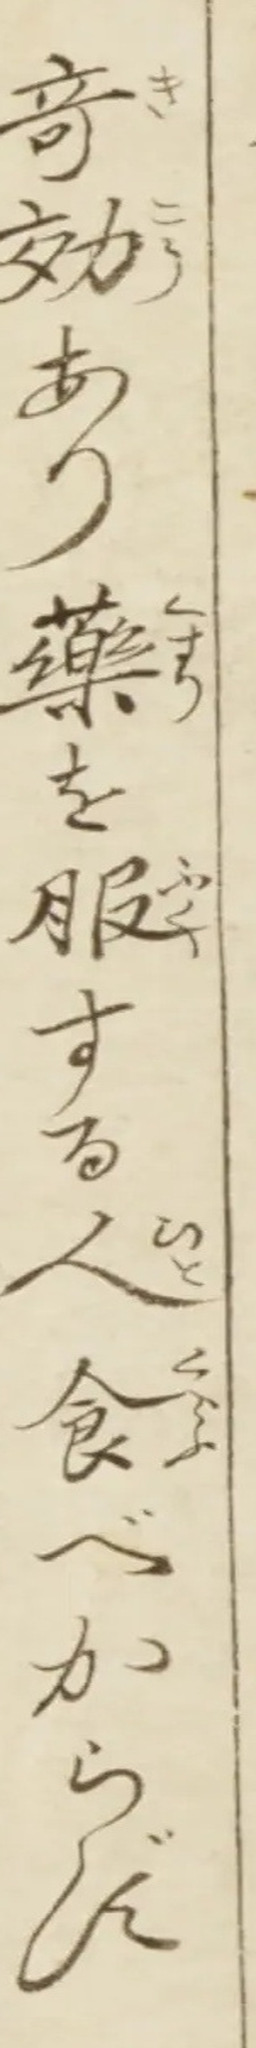奇効あり薬を服する人食べからず
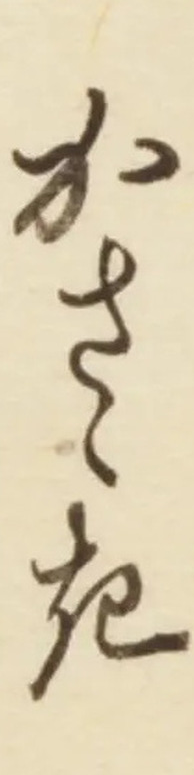かさゝき

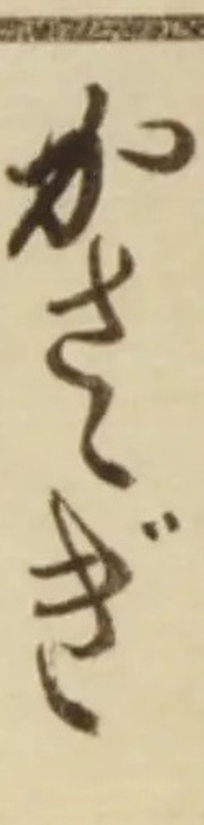かさゝぎ
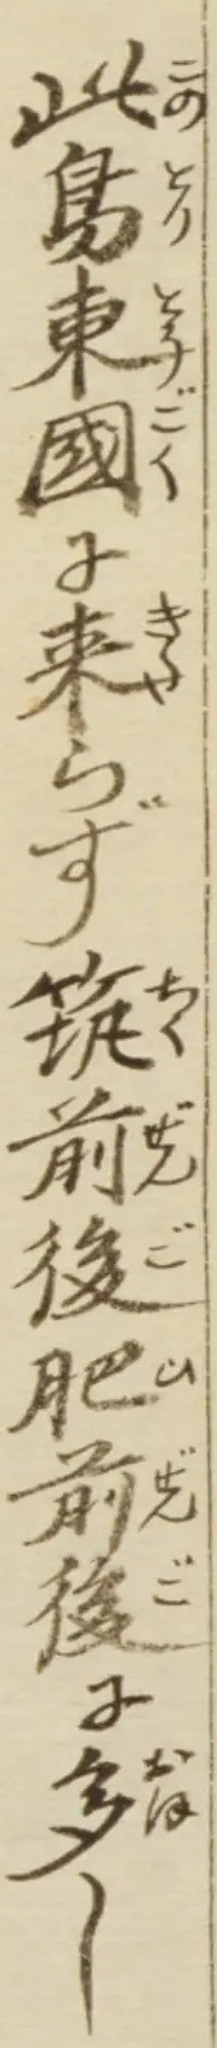此鳥東国に来らず筑前後肥前後に多し
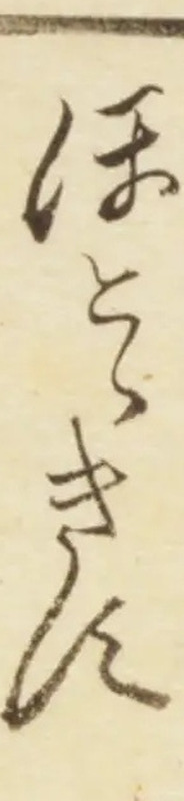ほとゝきす
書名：華鳥譜
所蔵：国立国会図書館 National Diet Library, JAPAN
